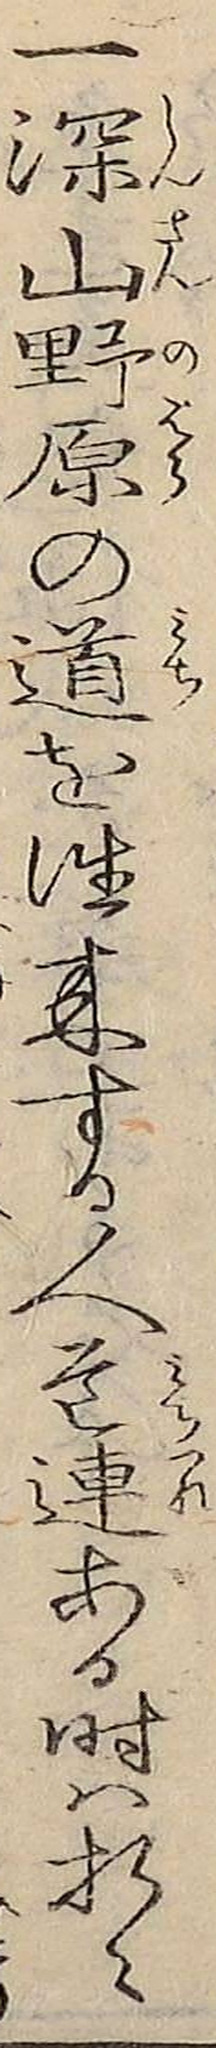一深山野原の道を往来する人道連ある時は折々
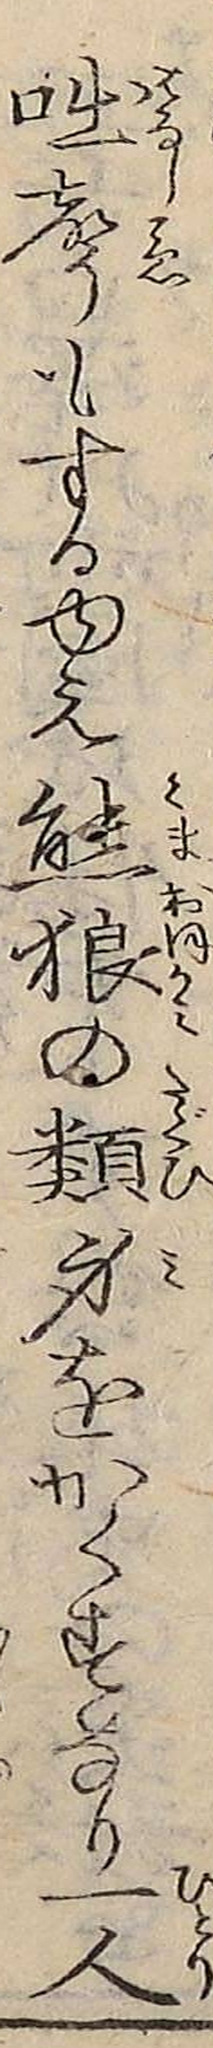咄声もするゆえ熊狼の類身をかくすなり一人
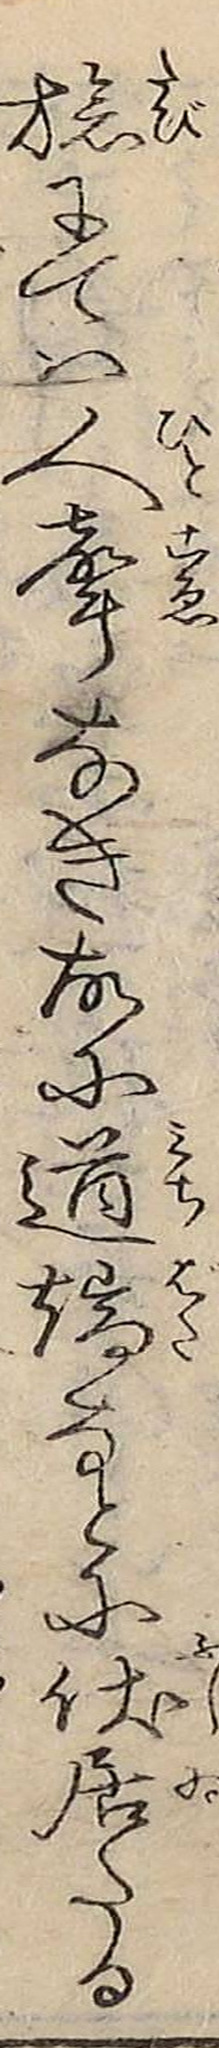旅にては人声なき故に道端なとに伏居たる
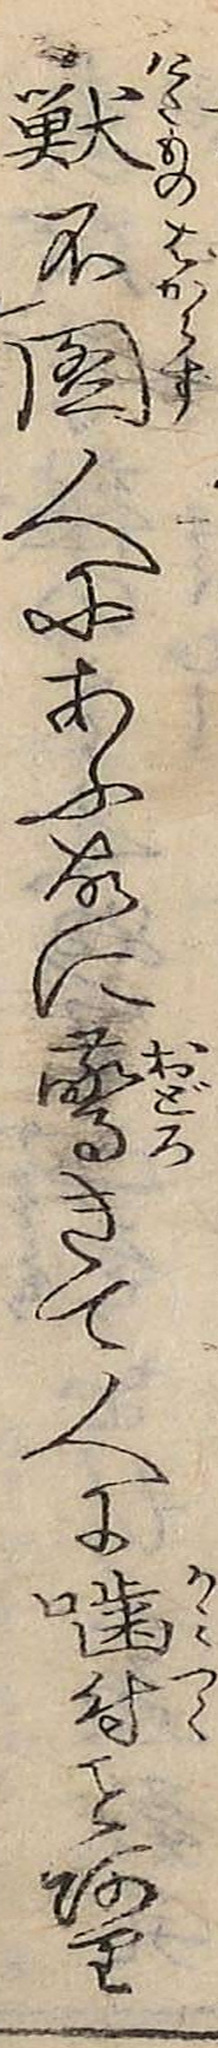獣不図人にあふ故に驚きて人に嚙付ことあり
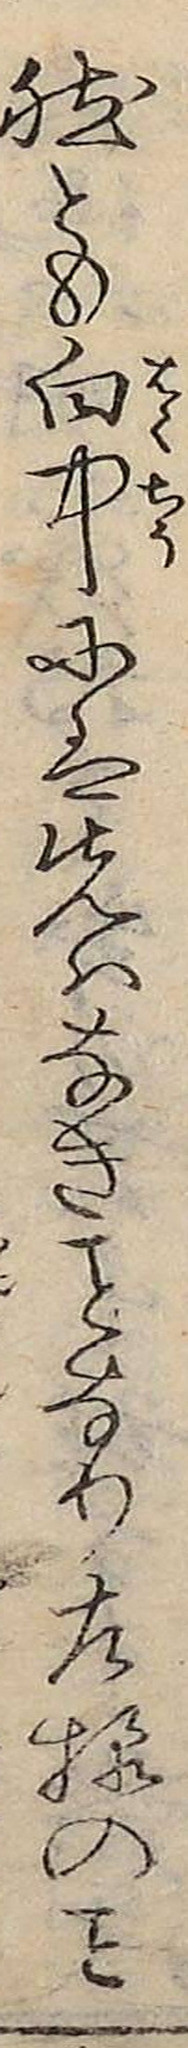然とも白中には先はなきことなり左様のこと
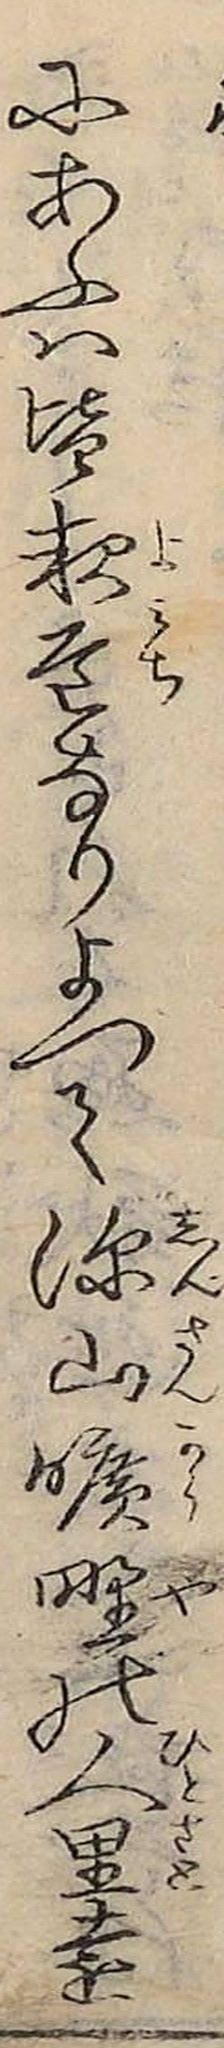にあふは皆夜道なりよつて深山曠野の人里遠
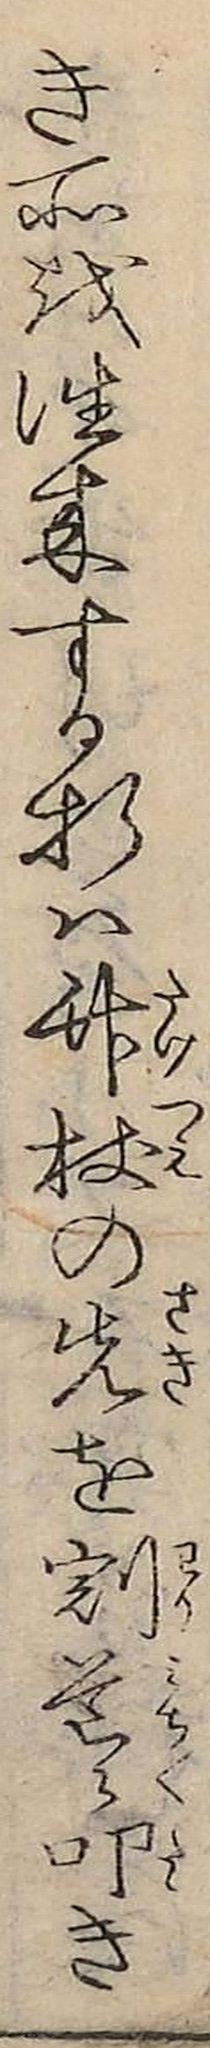き所を往来する折は竹杖の先を割道々叩き

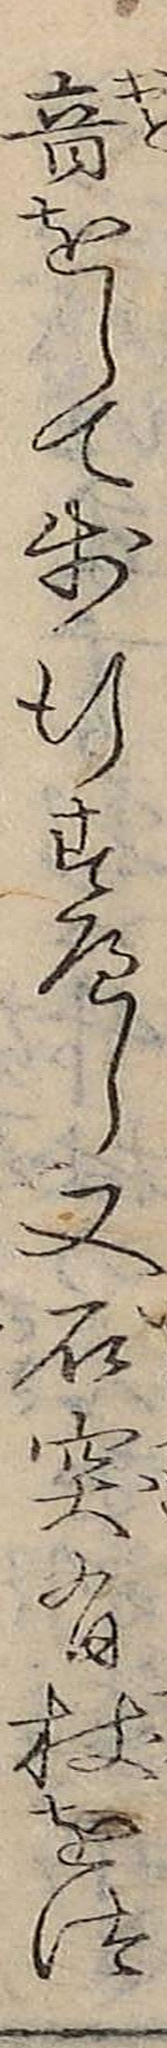音をして歩行すへし又石突有杖をつ
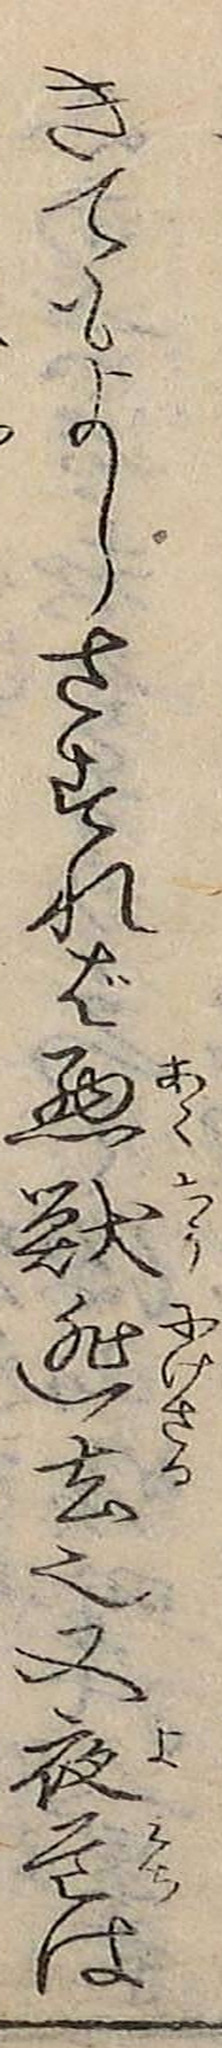きてもよしさすれば悪獣逃去也又夜道は
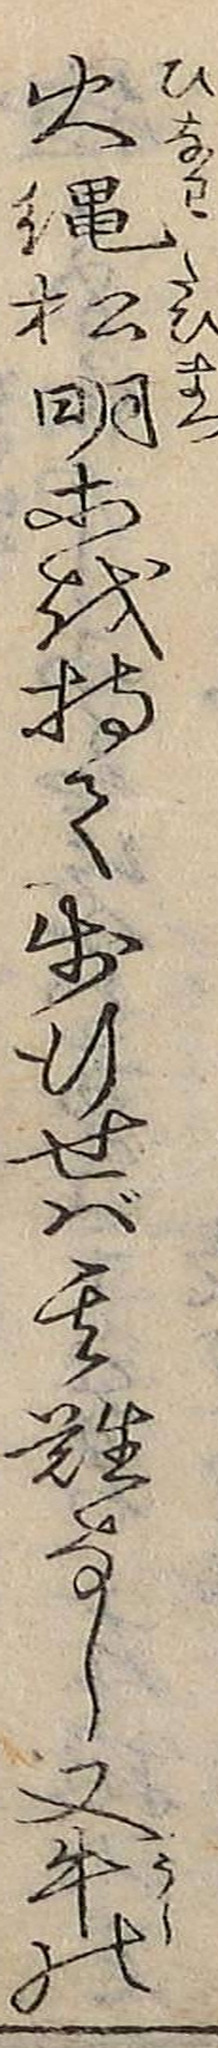火縄松明等を持て歩行せば其難なし又牛の
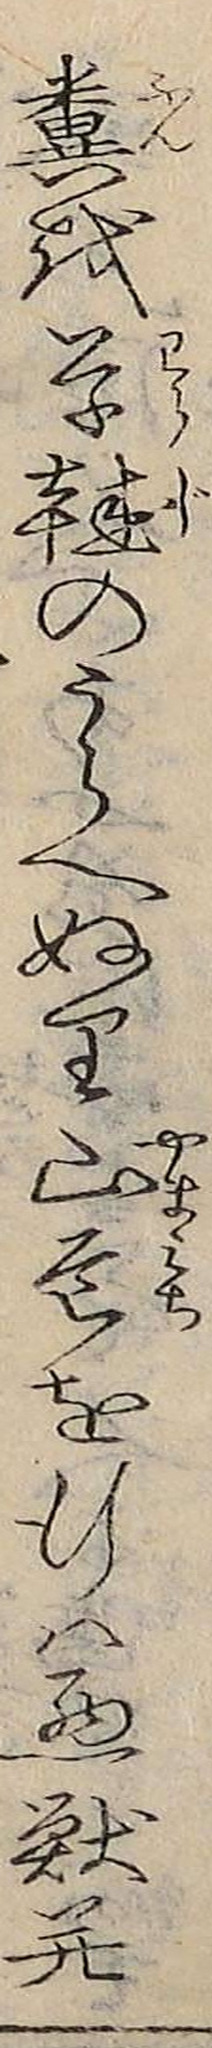糞を草鞋のうらへぬり山道を行は悪獣并
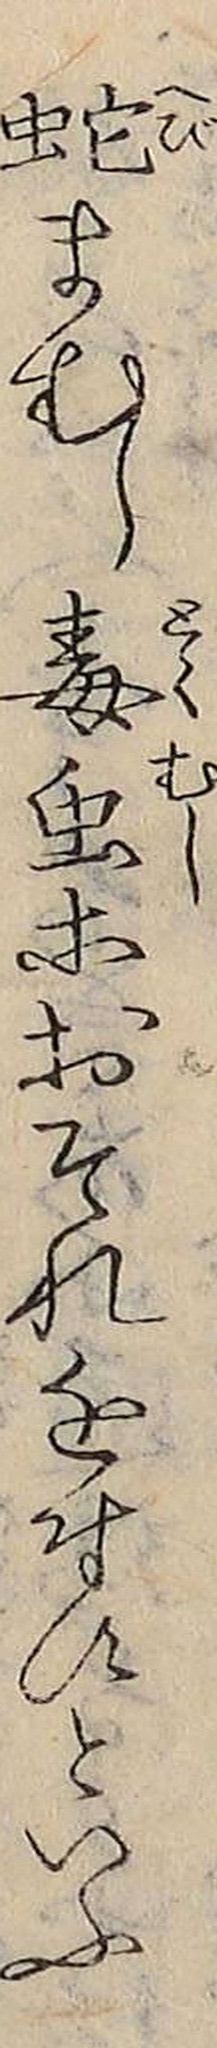蛇まむし毒虫等おそれ近付すといふ
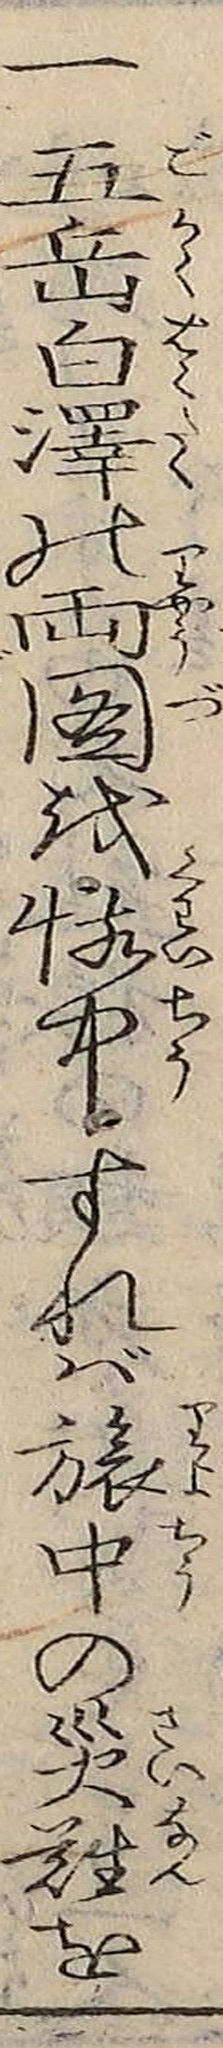一五岳白沢の両図を懐中すれば旅中の災難を
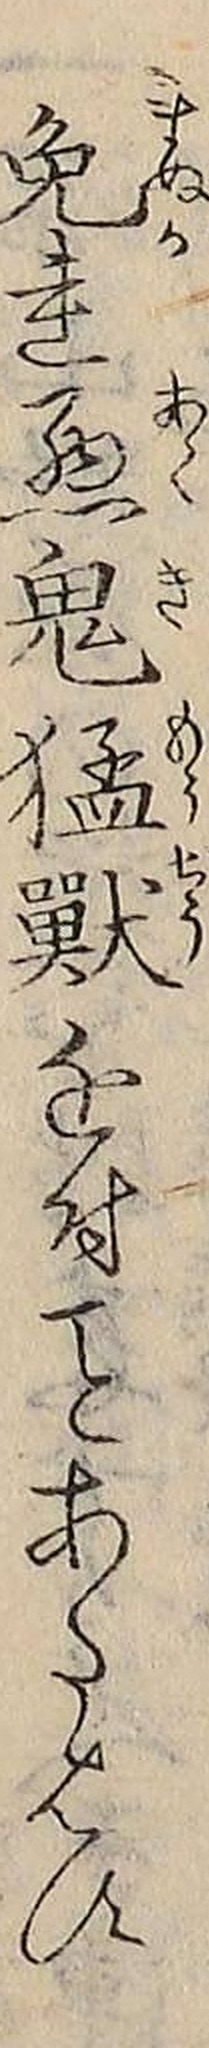免れ悪鬼猛獣近付ことあたはす
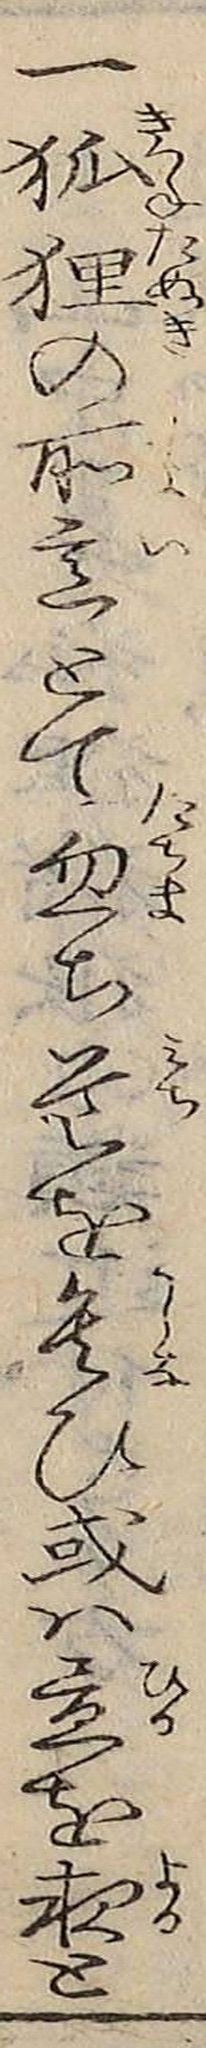一狐狸の所意とて忽ち道を失ひ或は昼を夜と
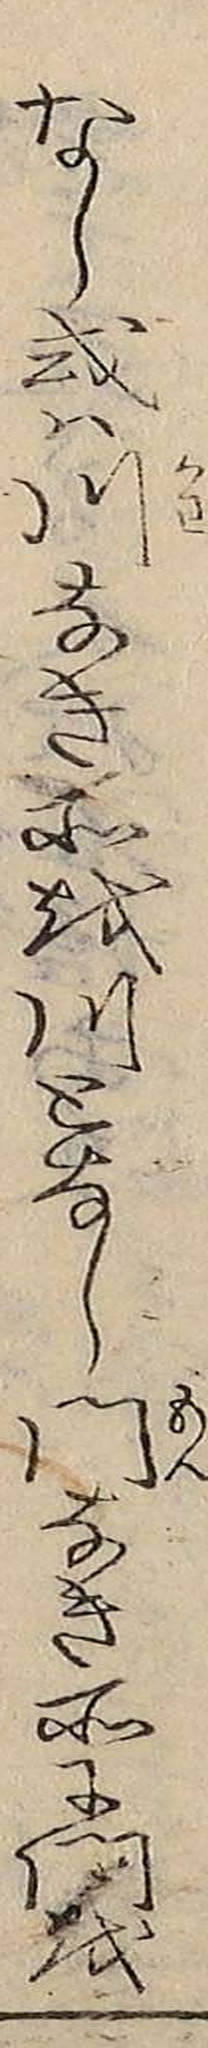なし或は川なき所を川となし門なき所に門を
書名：旅行用心集
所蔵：神戸大学附属図書館 国文学研究資料館
